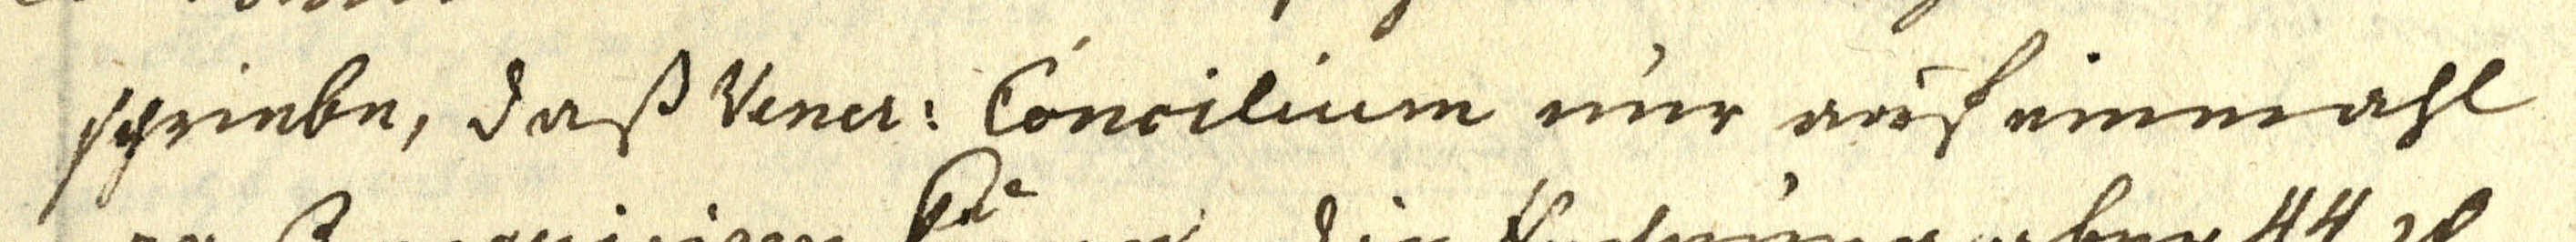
schriebe, daß Vener. Concilium nur auf einmahl
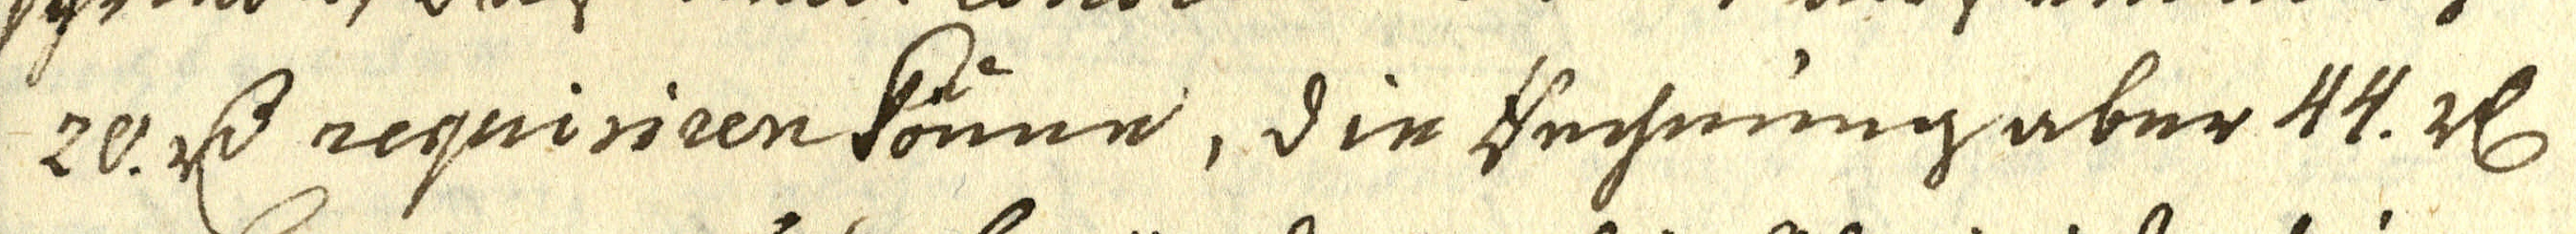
20. r requiriren könne, die Rechnung aber 44. r
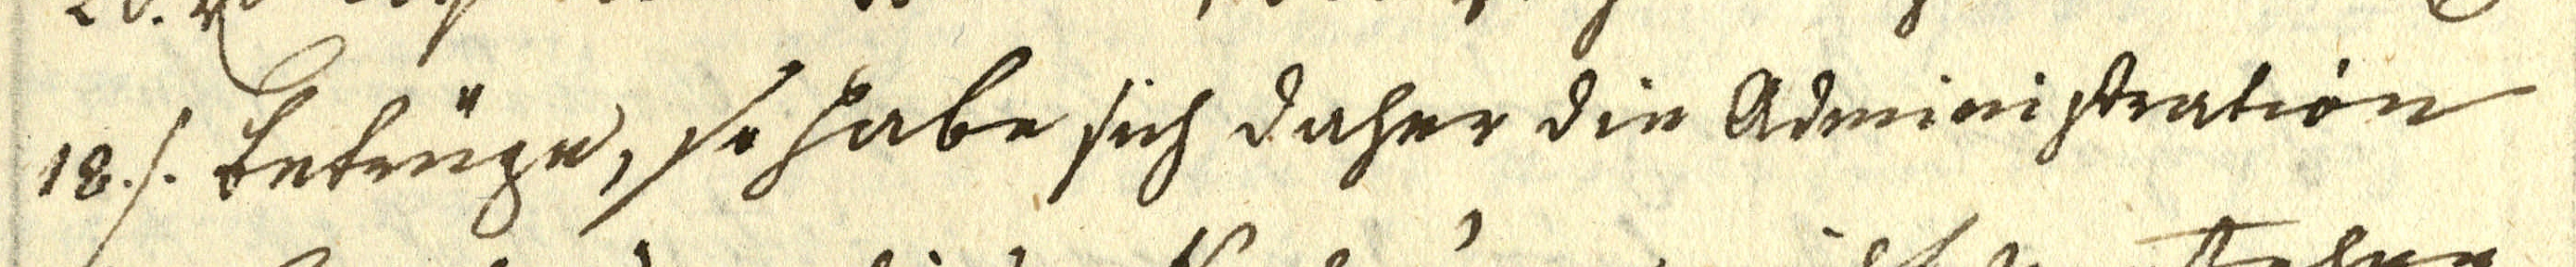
18. s. betrüge, so habe sich daher die Administration
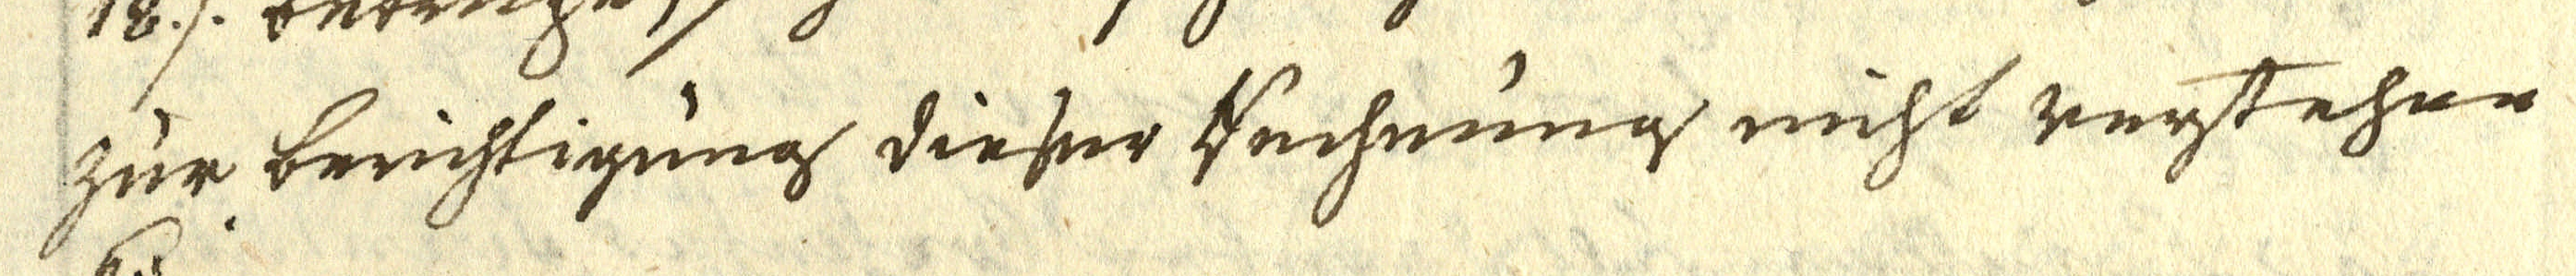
zur Berichtigung dieser Rechnung nicht verstehen
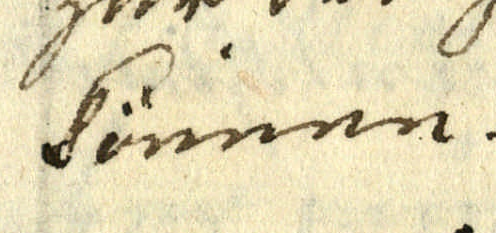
können.
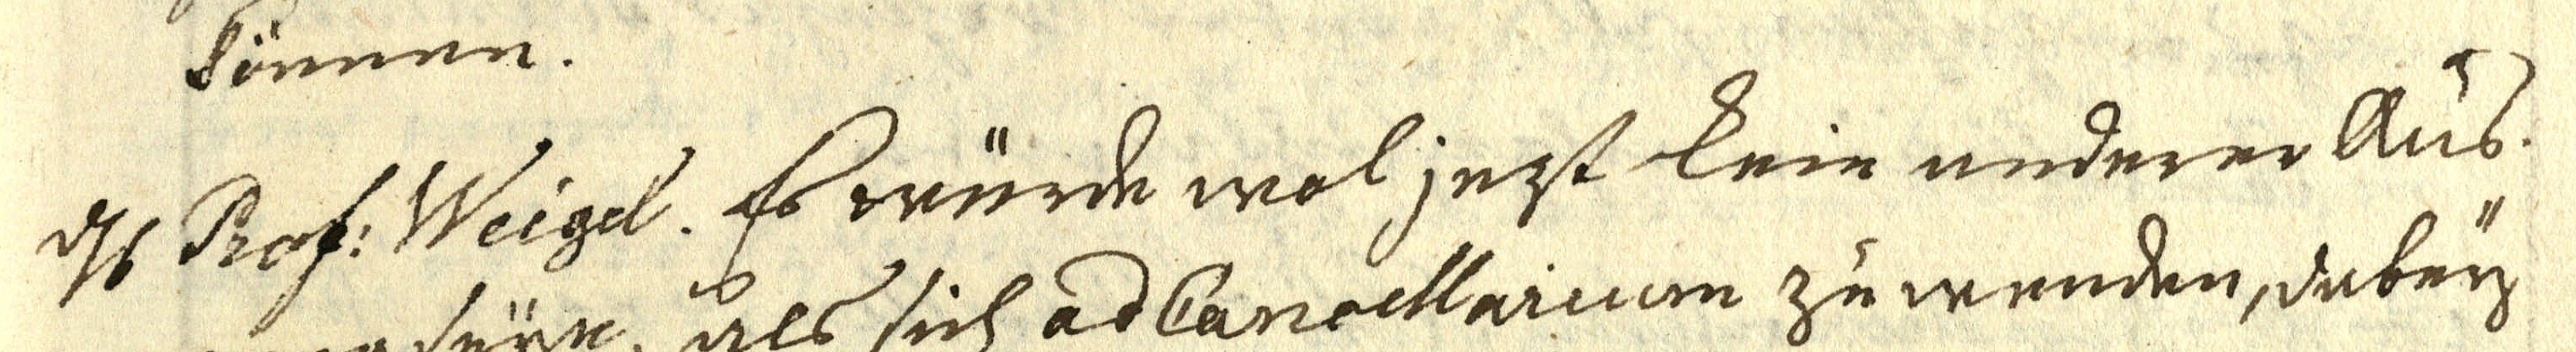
dh Prof. Weigel. Es würde wohl jezt kein anderer Aus¬
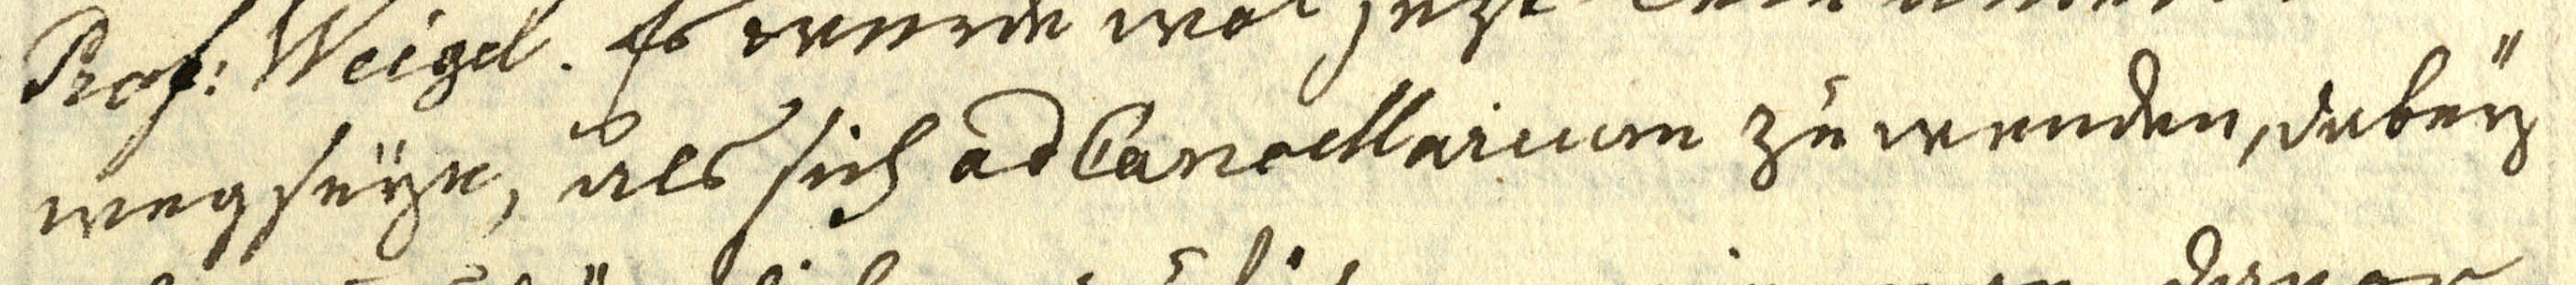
weg seÿn, als sich ad Cancellarium zu wenden, dabeÿ
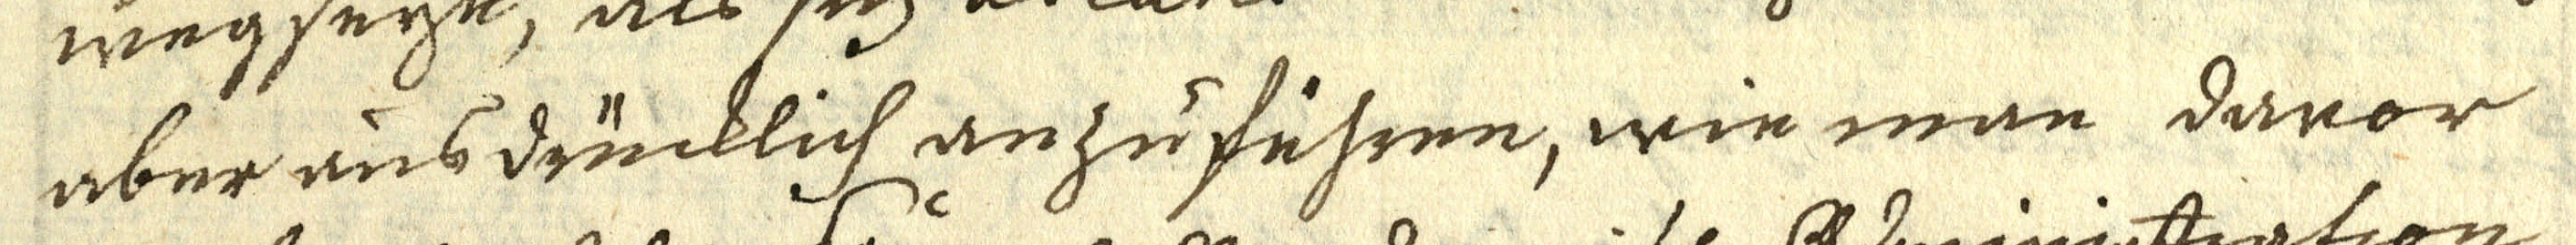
aber ausdrücklich anzuführen, wie man davor
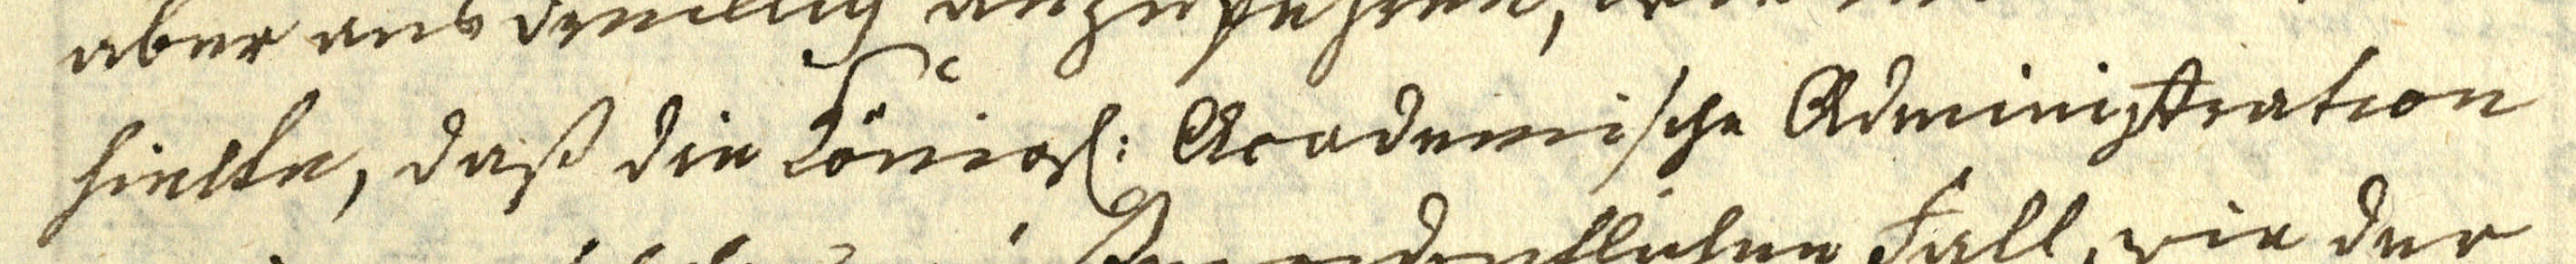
hielte, daß die Königl. Academische Administration
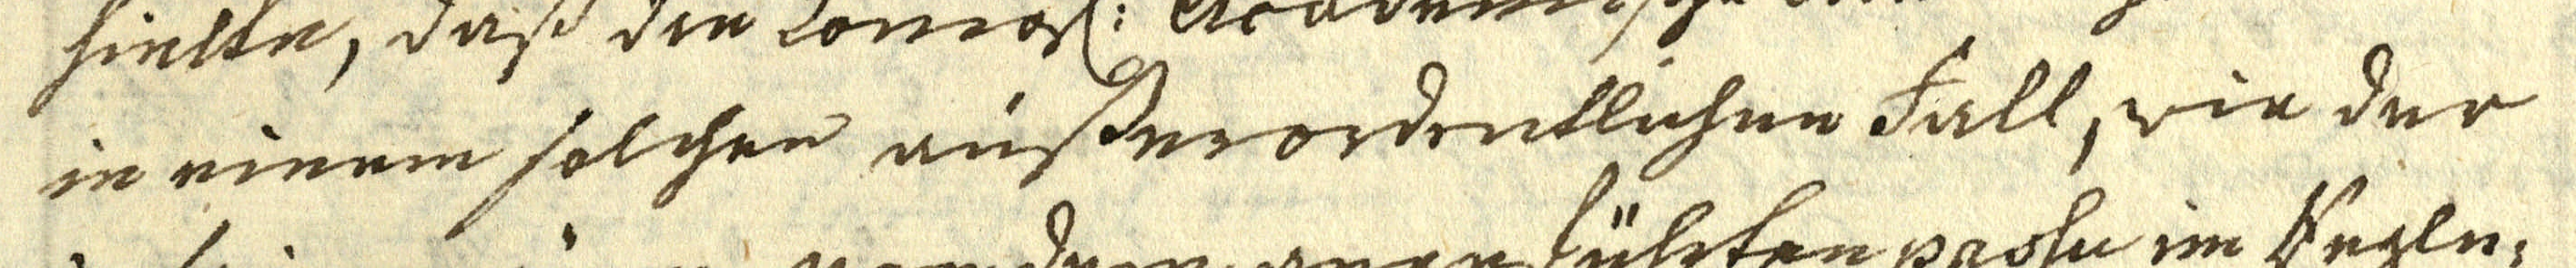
in einem solchen außerordentlichen Fall, wie der
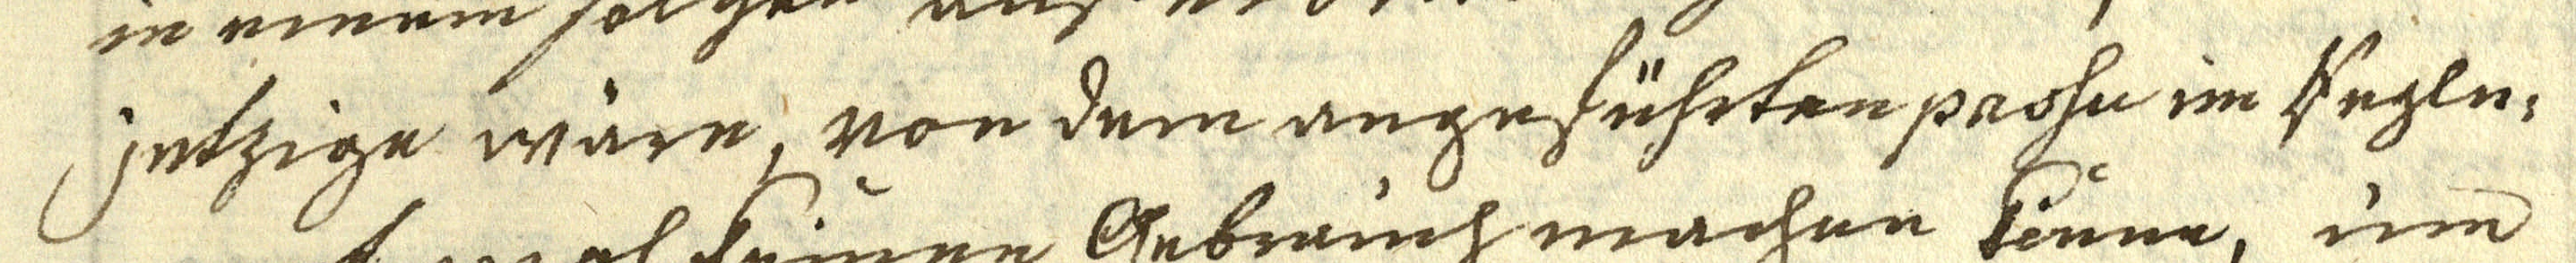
jetzige wäre, von dem angeführten passu im Regle¬
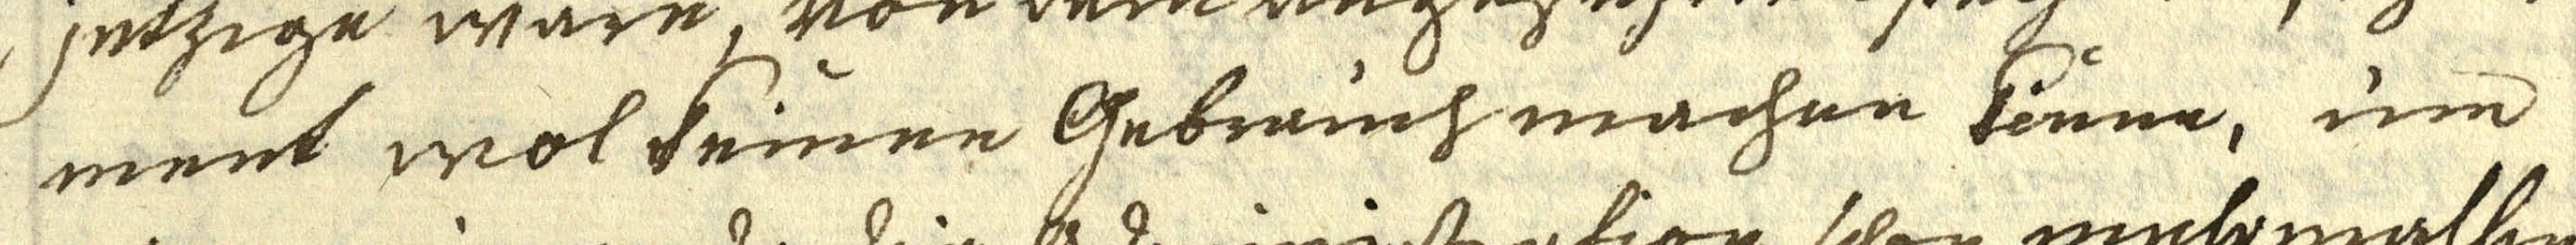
ment wol keinen Gebrauch machen könne, um
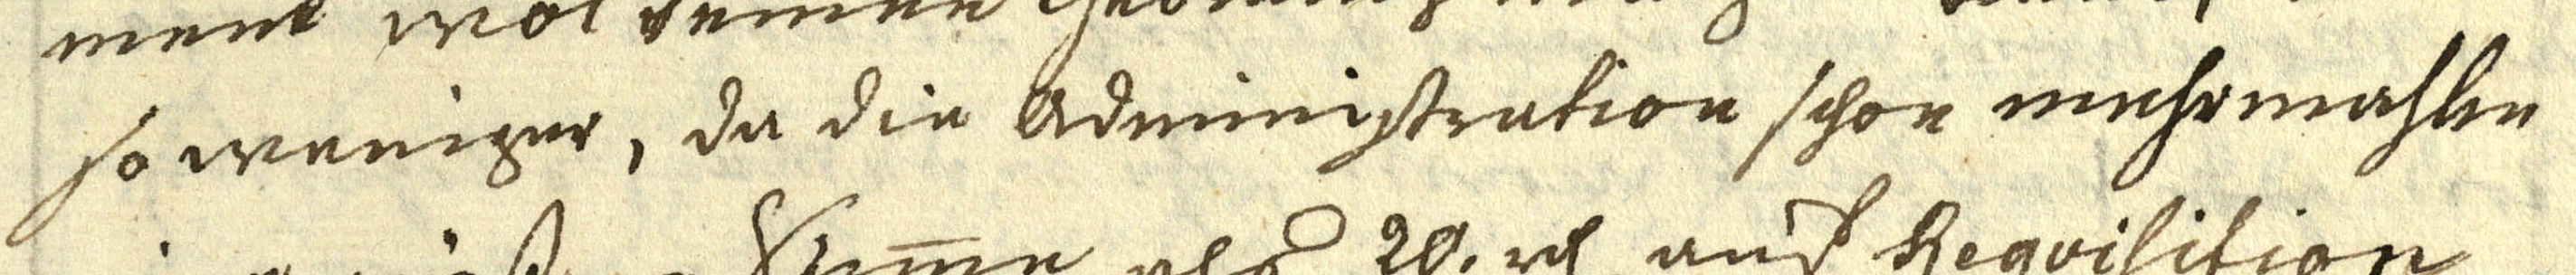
so weniger, da die Administration schon mehrmahlen
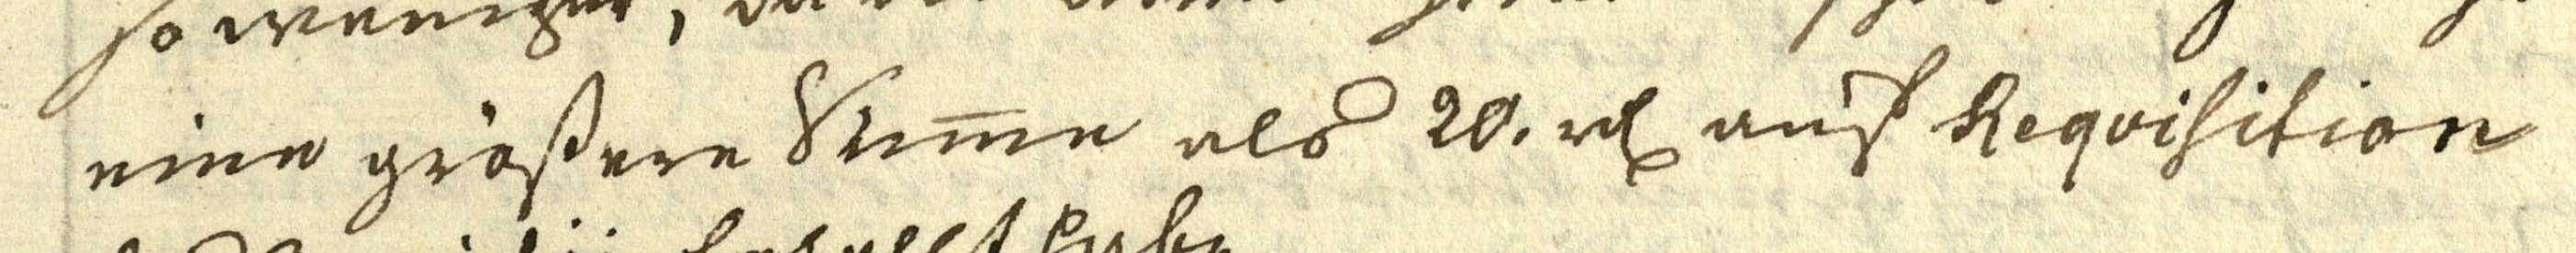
eine größern Sume als 20. r auf Requisition
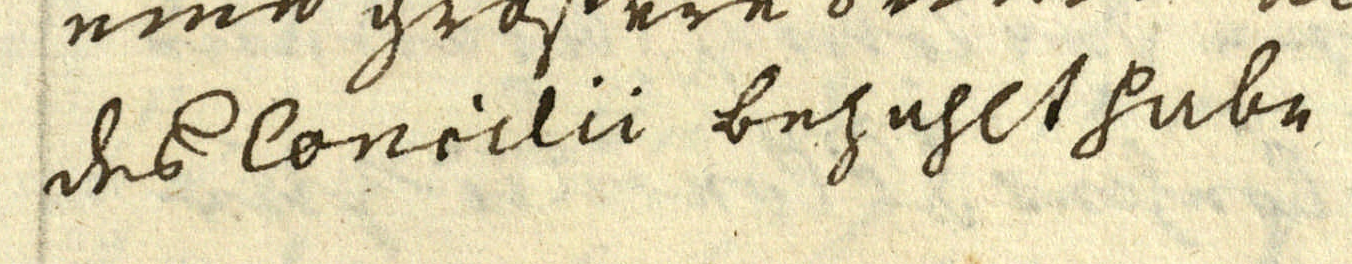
des Concilii bezahlt habe.
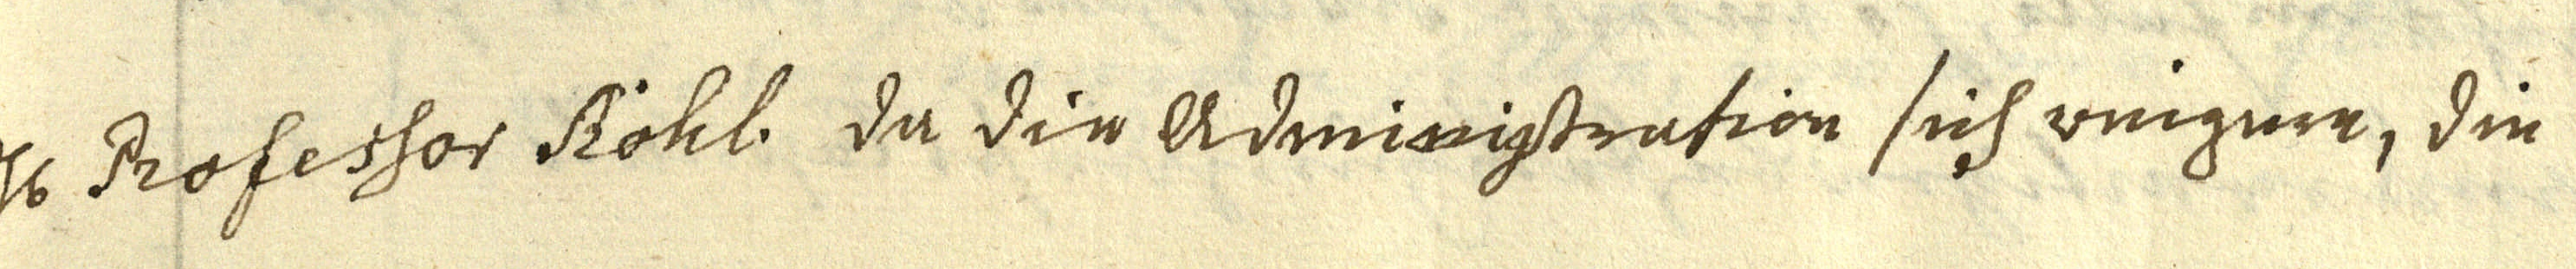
dh. Professor Röhl. Da die Administration sich weigere, die
